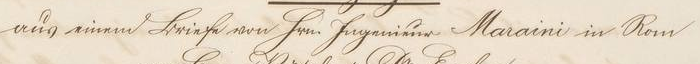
aus einem Briefe von Hrn Ingenieur Maraini in Rom
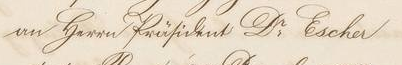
an Herrn Präsident Dr Escher
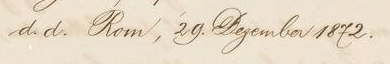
d. d. Rom, 29. Dezember 1872.
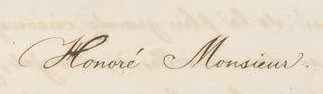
Honoré Monsieur,
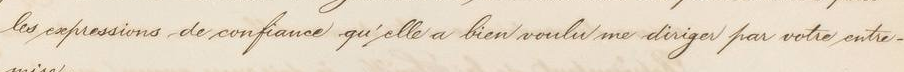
les expressions de confiance qu'elle a bien voulu me diriger par votre entre-
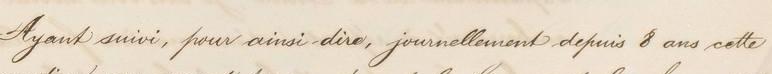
Ayant suivi, pour ainsi dire, journellement depuis 8 ans cette
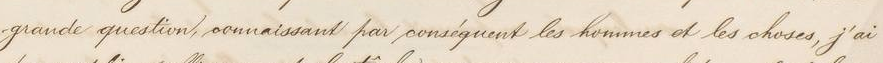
grande question, connaissant par conséquent les hommes et les choses, j'ai
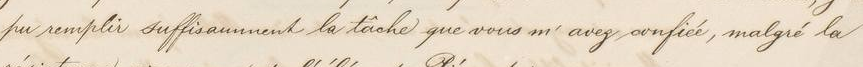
pu remplir suffisamment la tâche que vous m'avez confiée, malgré la
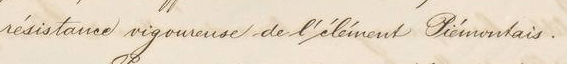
résistance vigoureuse de l'élément Piémontais.
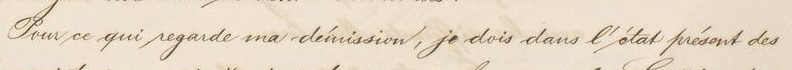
Pour ce qui regarde ma démission, je dois dans l'état présent des
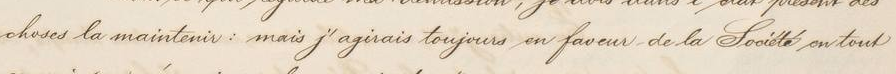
choses la maintenir: mais j'agirais toujours en faveur de la Société en tout
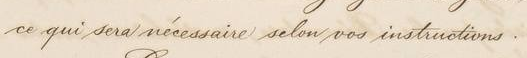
ce qui sera nécessaire selon vos instructions.
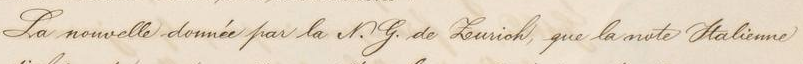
La nouvelle donnée par la N. G. de Zurich, que la note Italienne
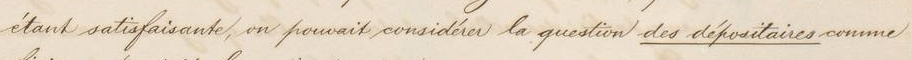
étant satisfaisante, on pouvait considérer la question des dépositaires comme
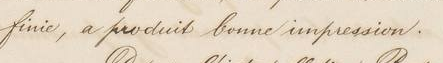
finie, a produit bonne impression.
